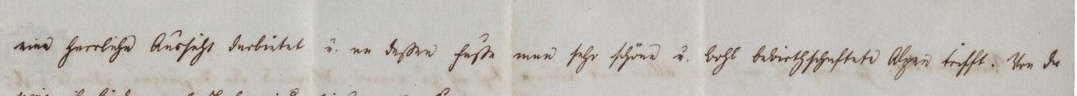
eine herrliche Aussicht darbietet u. an dessen Fuße man sehr schöne u. wohl bewirthschaftete Alpen trifft. Von da
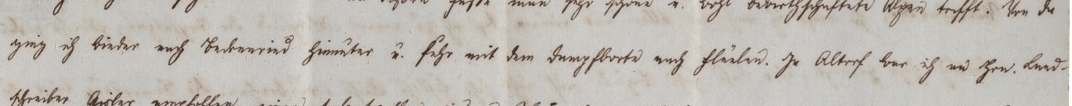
ging ich wieder nach Beckenried hinunter u. fuhr mit dem Dampfboote nach Flüelen. In Altorf war ich an Hrn. Land-
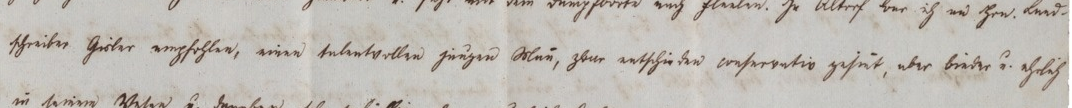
schreiber Gisler empfohlen, einen talentvollen jungen Mann, zwar entschieden conservativ gesinnt, aber bieder u. ehrlich
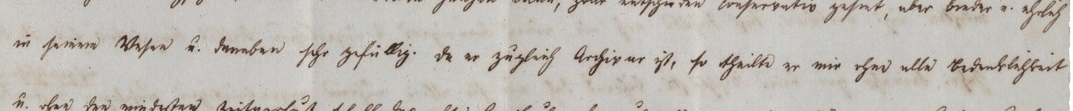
in seinem Wesen u. daneben sehr gefällig. Da er zugleich Archivar ist, so theilte er mir ohne alle Bedenklichkeit
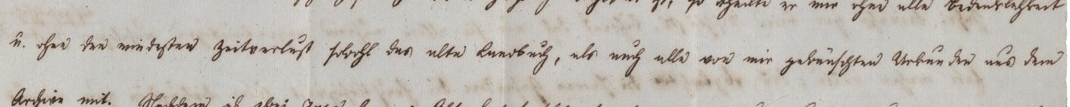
u. ohne den mindesten Zeitverlust sowohl das alte Landbuch, als auch alle von mir gewünschten Urkunden aus dem
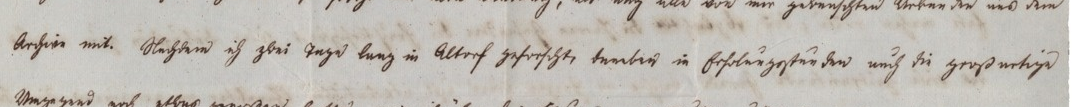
Archive mit. Nachdem ich zwei Tage lang in Altorf geforscht, daneben in Erholungsstunden auch die großartige
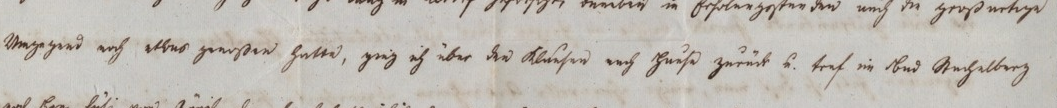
Umgegend noch etwas genossen hatte, ging ich über den Klausen nach Hause zurück u. traf im Bad Stachelberg
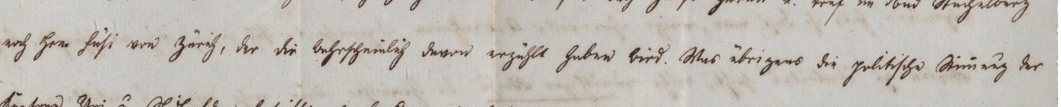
noch Hrn. Fäsi von Zürich, der dir wahrscheinlich davon erzählt haben wird. Was übrigens die politische Stimmung der
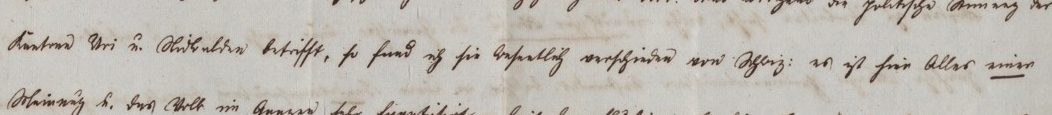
Kantone Uri u. Nidwalden betrifft, so fand ich sie wesentlich verschieden von Schwiz: es ist hier Alles einer
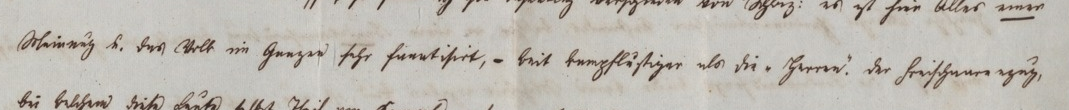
Meinung u. das Volk im Ganzen sehr fanatisirt, – weit kampflustiger als die «Herren». Freischaarenzug,
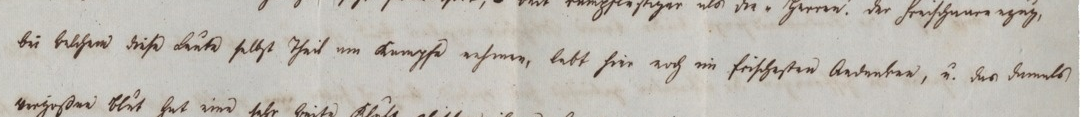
bei welchem diese Leute selbst Theil am Kampfe nahmen, lebt hier noch im frischesten Andenken, u. das damals
